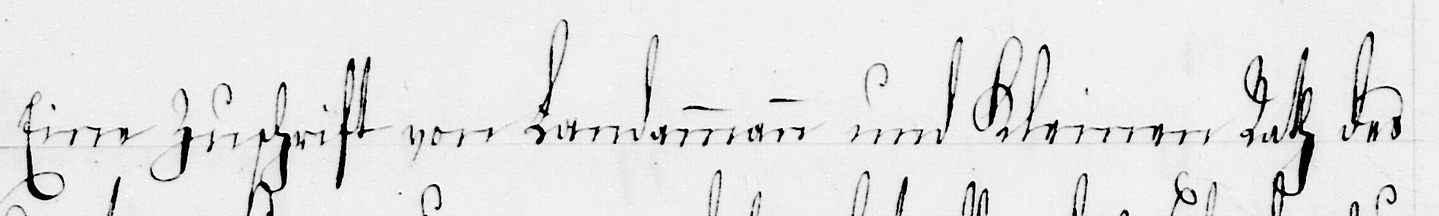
Eine Zuschrift von Landammann und Kleinen Rath des
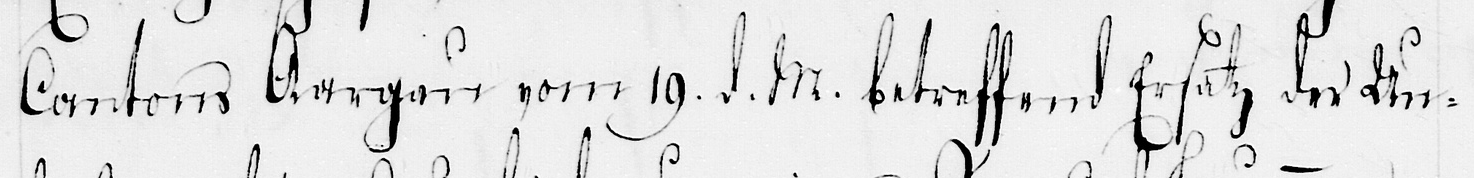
Cantons Aargau vom 19. d. M. betreffend Ersatz der Un¬
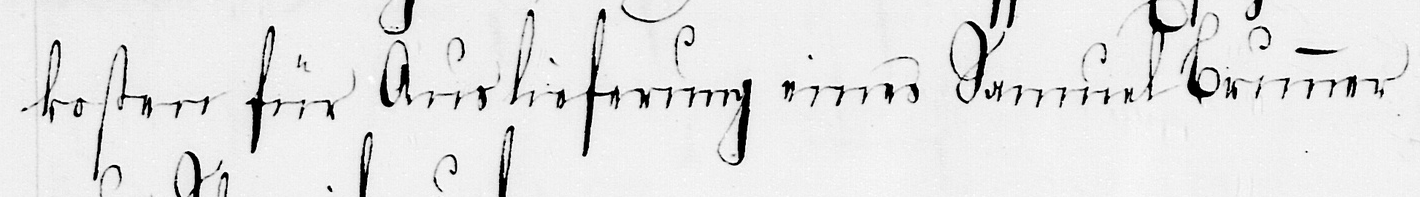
kosten für Auslieferung eines Samuel Brunner
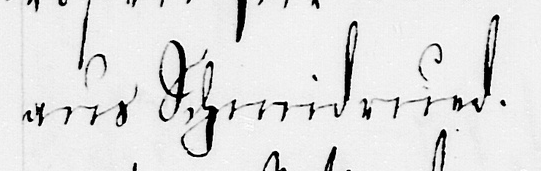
aus Schmidrued.
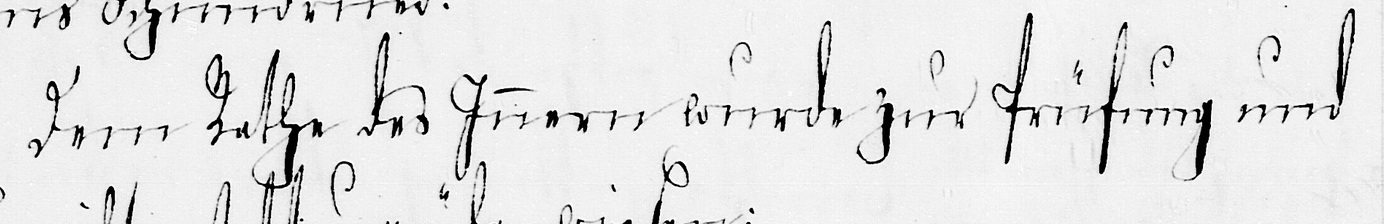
Dem Rathe des Innern wurde zur Prüfung und
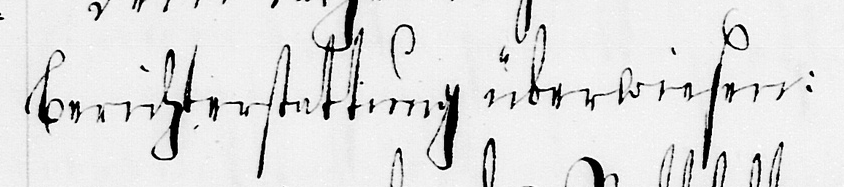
Berichterstattung überwiesen:
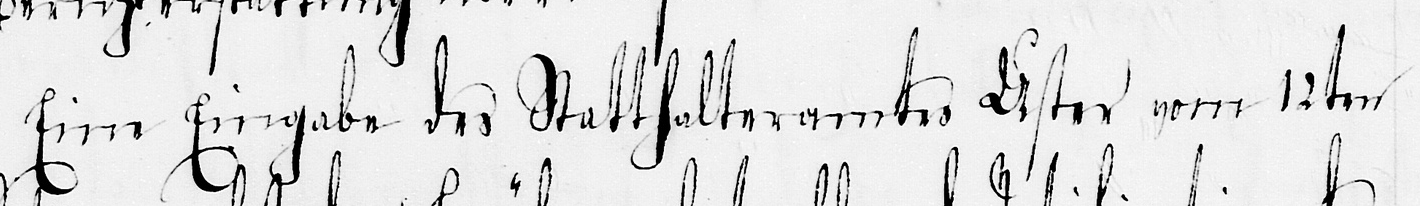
Eine Eingabe des Statthalteramtes Uster vom 12ten
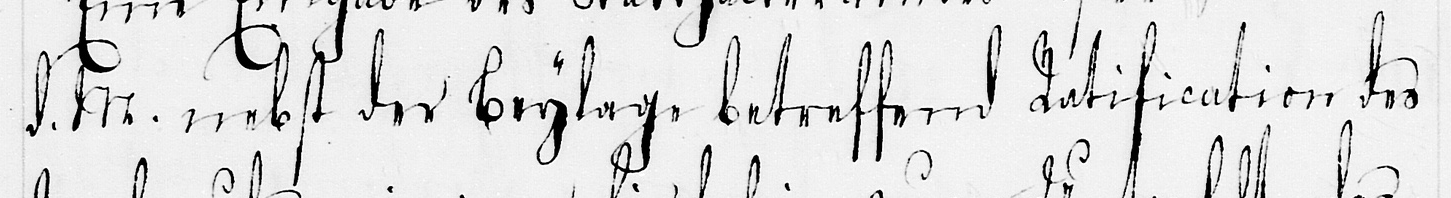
d. M. nebst der Beylage betreffend Ratification des
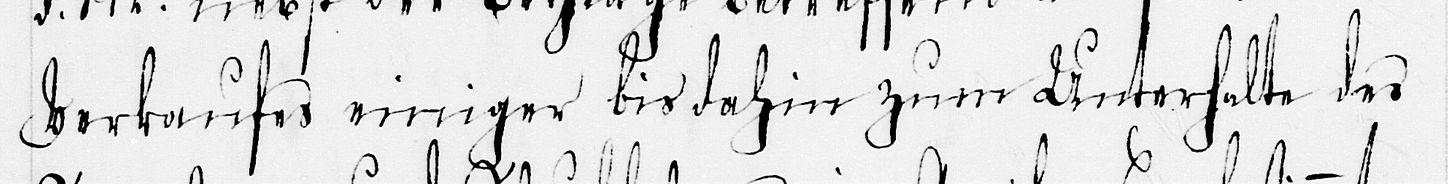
Verkaufes einiger bis dahin zum Unterhalte des
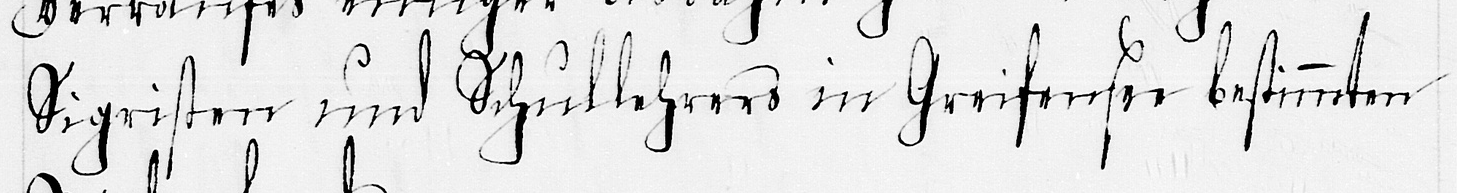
Sigristen und Schullehrers in Greifensee bestimmten
